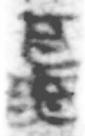聶（攝）
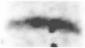一
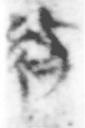紫
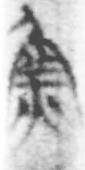魚
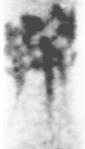與
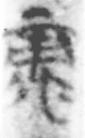彔（綠）
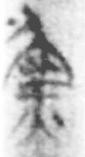魚
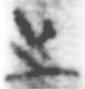之
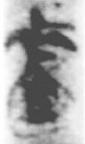○（箙）
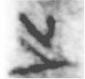之
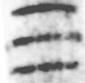三
